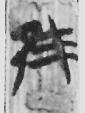隹
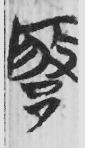{殷邑}（殷）
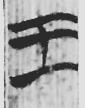王
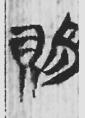賜
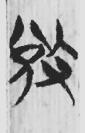敓（說）
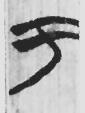于
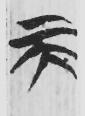天
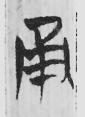甬
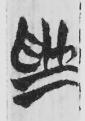爲
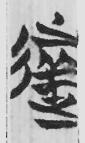{辶止㚔}（失）
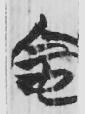{宀𠁩}（仲）
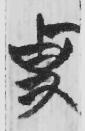史
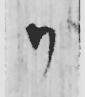人
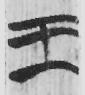王
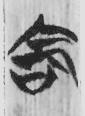命
